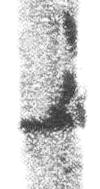之
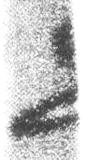也
